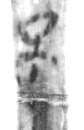𠭁
